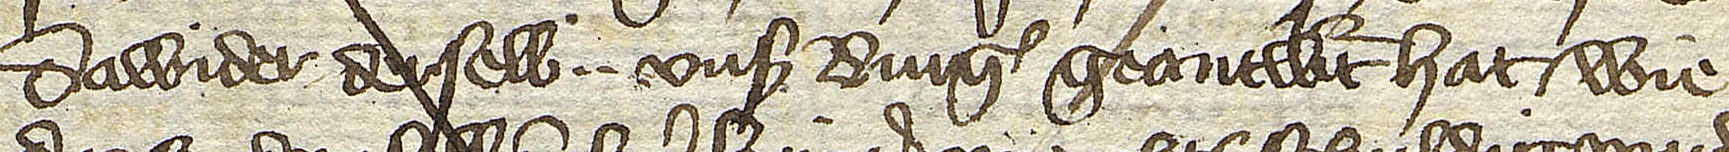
Dawider derſelb ~ vnſ* Burg* geantw*t hat / wie
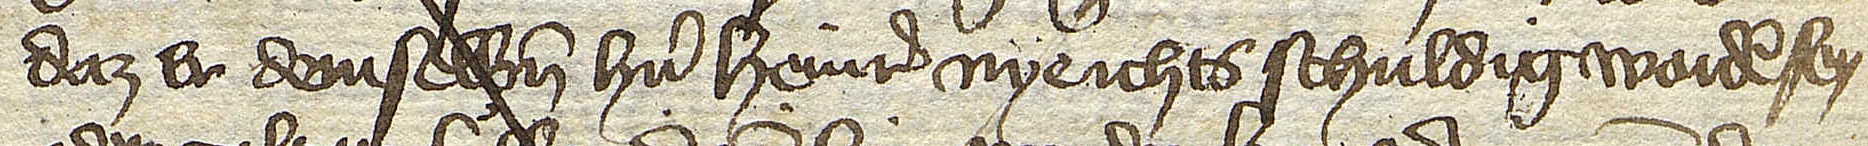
daʒ Er demſelbn* hn* heinr* nye ichts ſchuldig worde* ſey
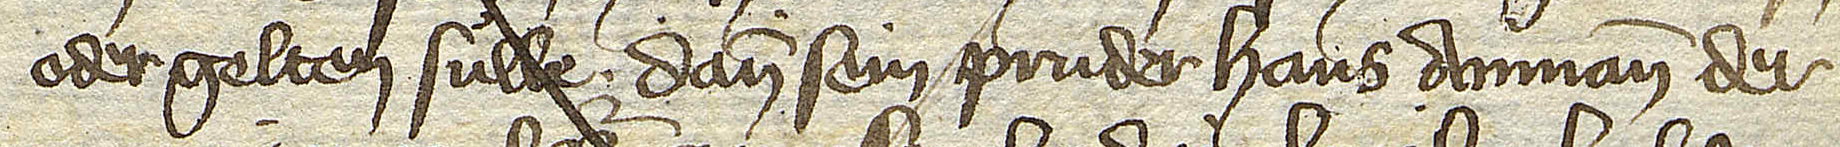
oder gelten ſülle . dan* ſein pruder hans Armman* der
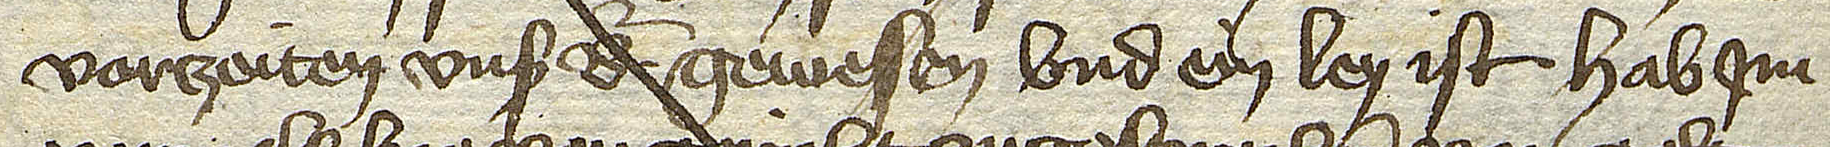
vorcʒeiten vnſ* B* . geweſen vnd ein ley iſt hab Im
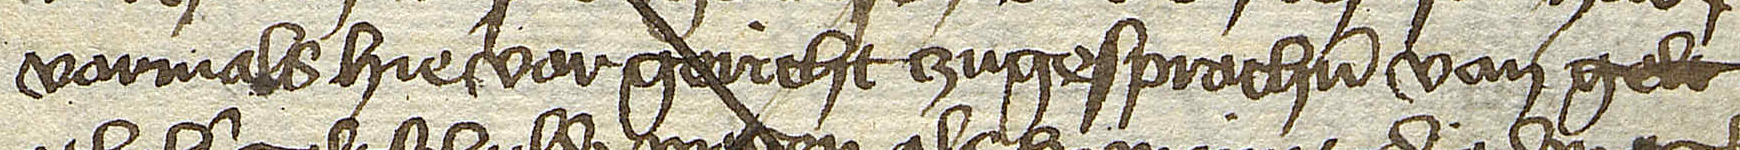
vormals hie vor gericht cʒugeſprochn* von gelt
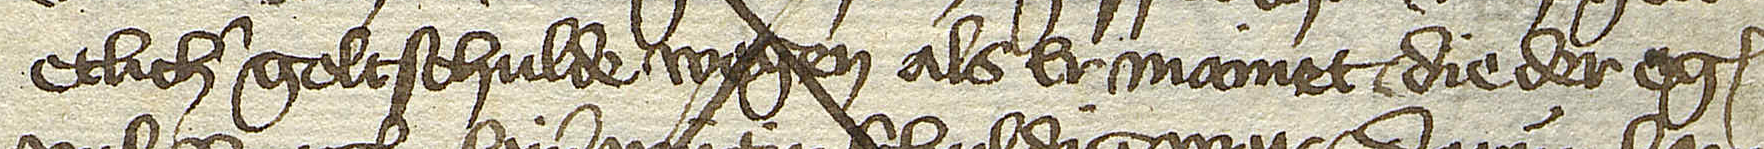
etlich* geltſchulde wegen als Er mainet / die der eg*
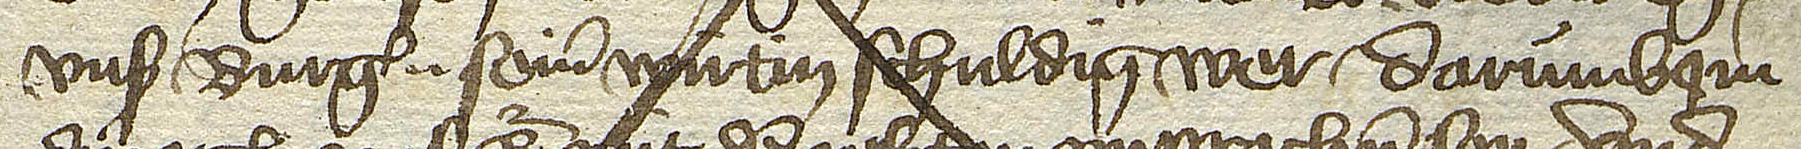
vnſ* Burg* ~ ſein* wirtin ſchuldig wer / darümb Im
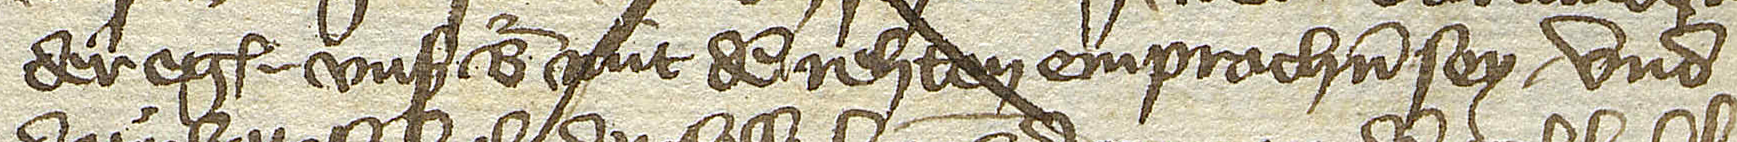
der eg* ~ vnſ* B* mit d* rehten einprochn* ſey / Vnd
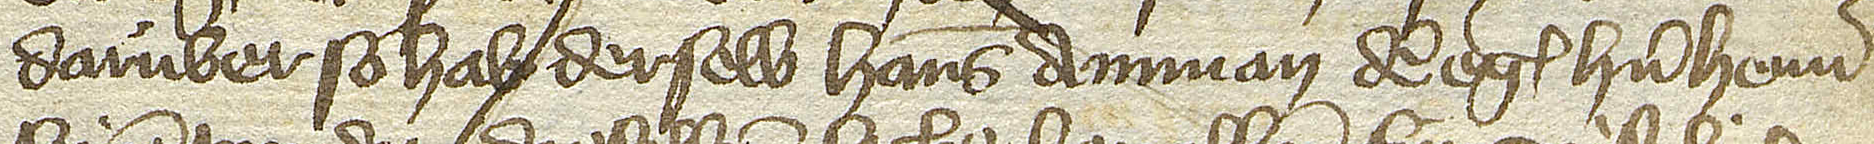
darüber ſo hab derſelb han*s Armman d* eg* hn* heinr*
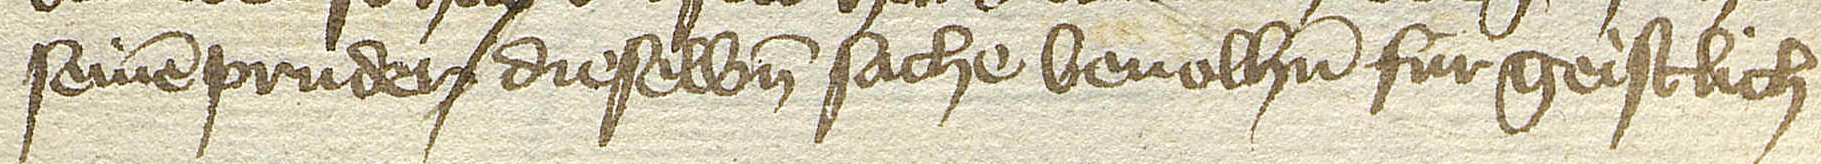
ſeine* pruder dieſelbn* ſache beuolhn* für geiſtlich
